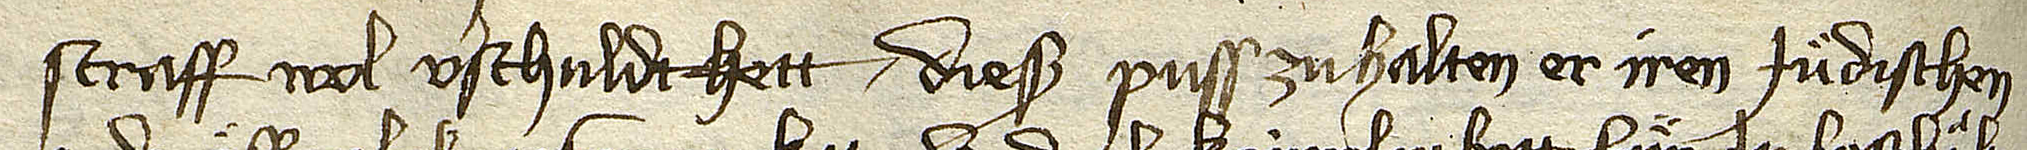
ſtraff wol v*ſchuldt hett / Dieſ* puſſ ʒu halten er iren Iüdiſchen
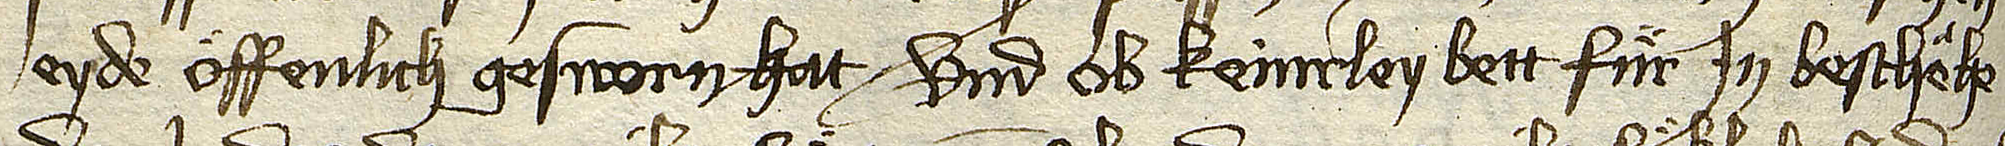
eyde öffenlich geſworn hat / Vnd ob keinrley bett für In beſchëhe
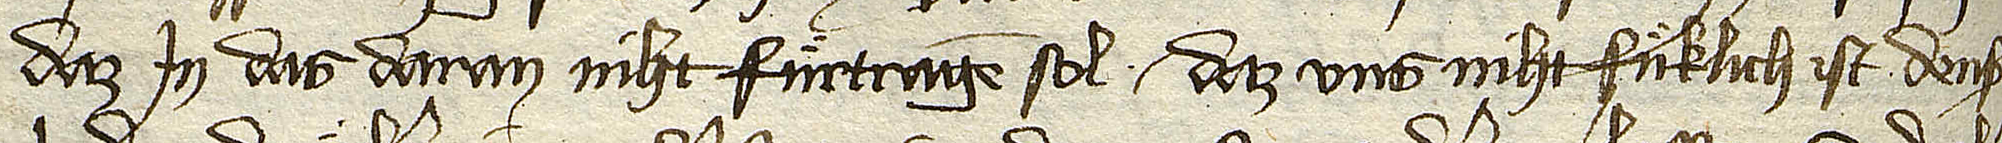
daʒ In das daran niht fürtrage* ſol . / daʒ vns niht füklich iſt . denſ*
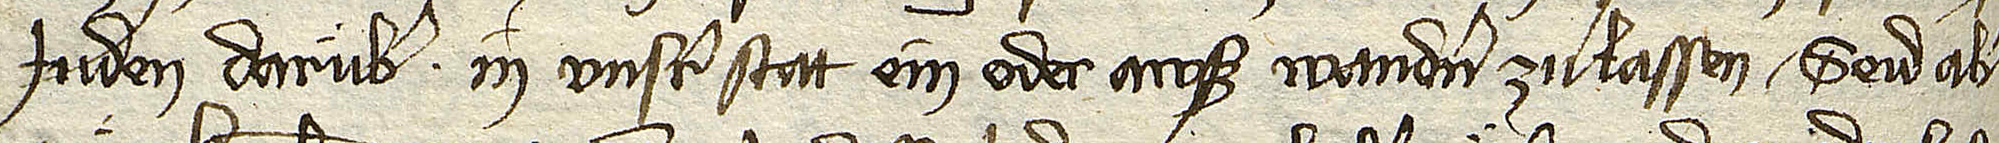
Iuden darüb* . in vnſ*r ſtatt ein oder awſʒ wand*n ʒu laſſen / Seid ab*
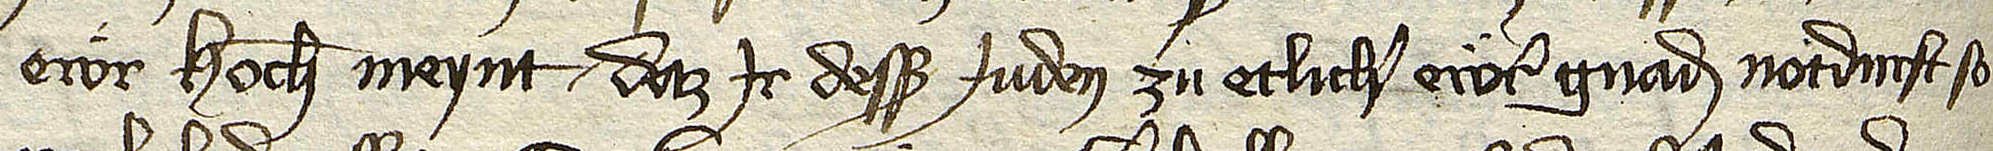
eẅr hoch* meynt / daʒ Ir deſſ* Iuden ʒu etlich* eẅr* gnad* notdurft ſo
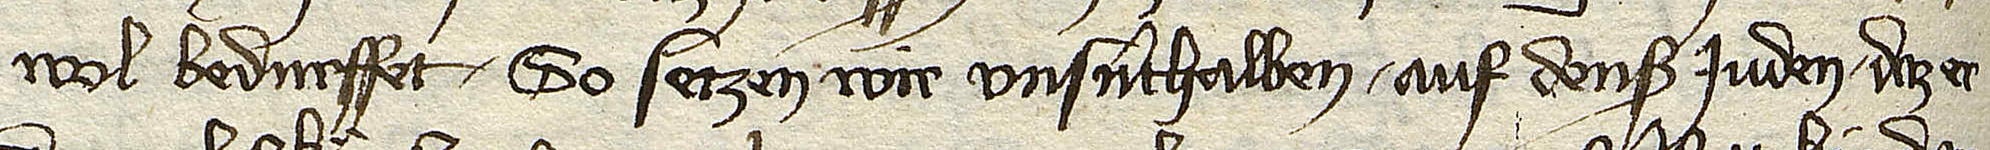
wol bedurffet / So ſecʒen wir vnſ*nthalben / auf denſ* Iuden / daʒ er
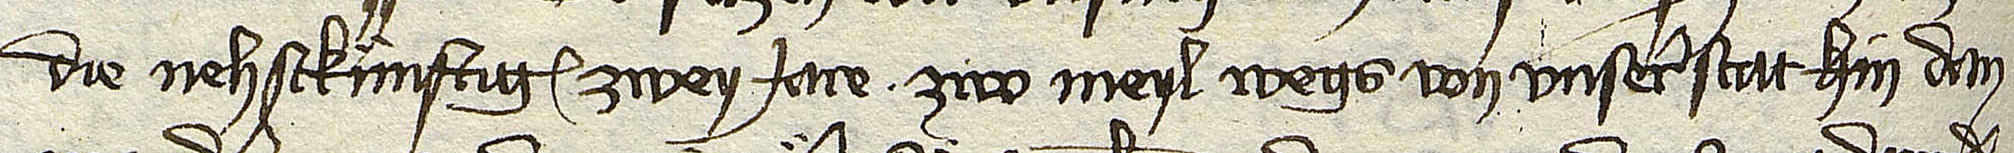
die nehſtkünſtig* ʒwey Iare . ʒwo meyl weg* von vnſer* ſtat hin dan
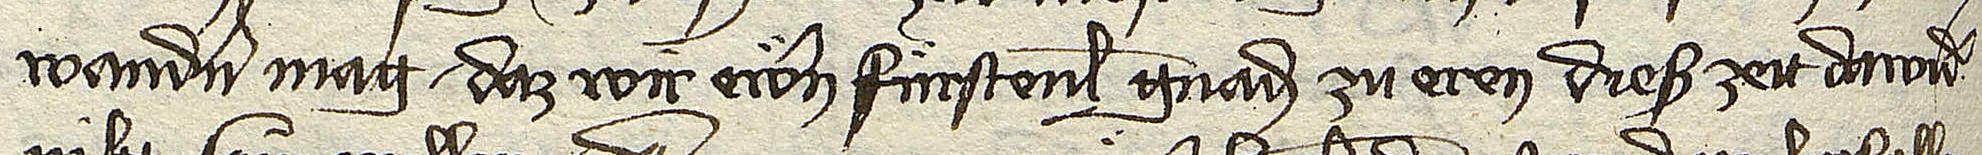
wand*n mag / daʒ wir eẅ*n fürſtenl* gnad* ʒu eren dieſ* ʒeit dawid*
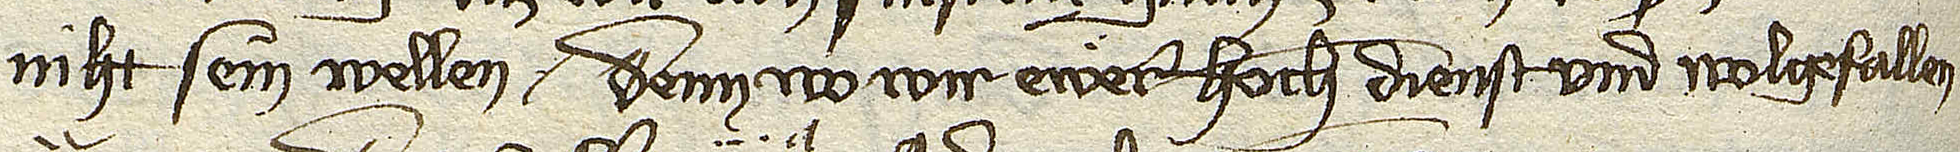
niht ſein wellen / Denn wo wir eẅer* hoch* dienſt vnd wolgefallen
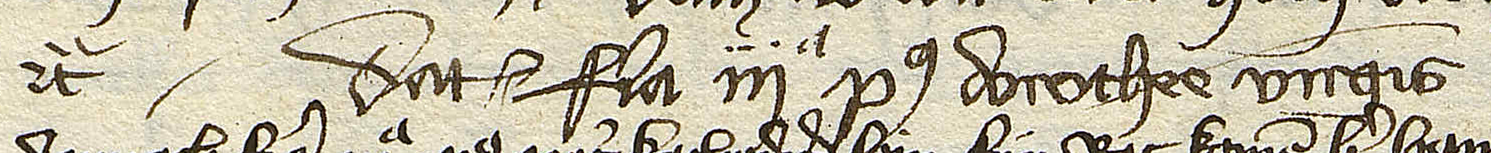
ec* / Dat . f*ia iii* p* dorothee virg*is
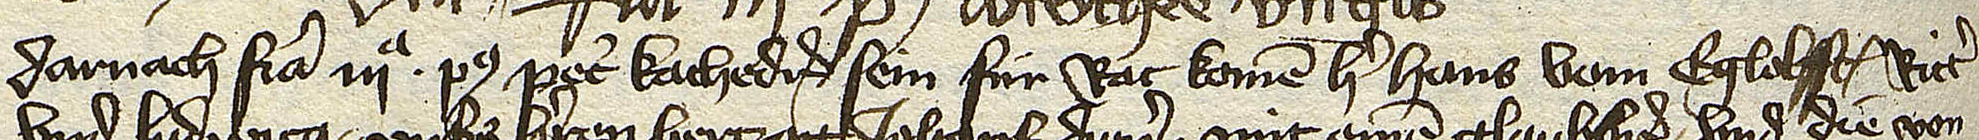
darnach f*ia iii* . p* pet* kathedr* ſein für Rat kome* h* hans vom Eglofſſt* Ritt*
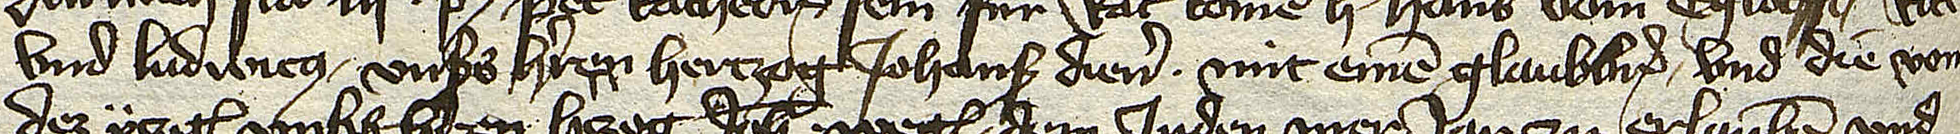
Vnd ludwicg / vnſ*s h*ren hercʒog Iohanſ* dien* . mit eine* glaubbr* / Vnd die von
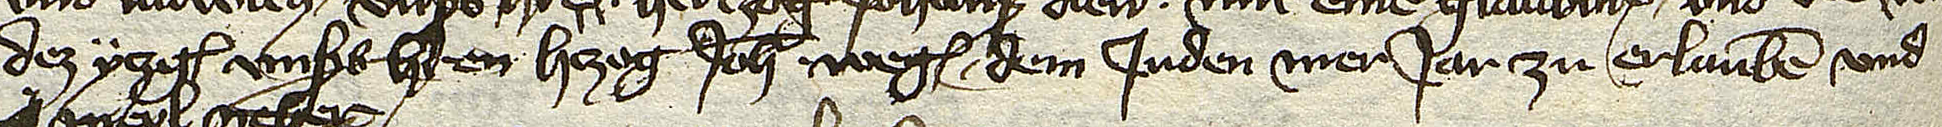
deʒ ycʒg* vnſs* h*ren h*cʒog Ioh* . weg* / dem Iuden mer Iar ʒu erlaube* vnd
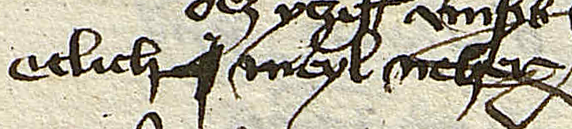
etlich % meyl neher
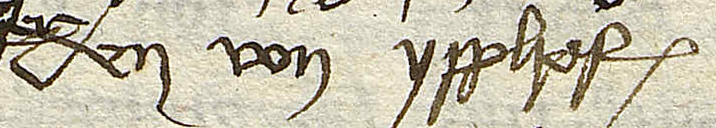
Den von ypphof*
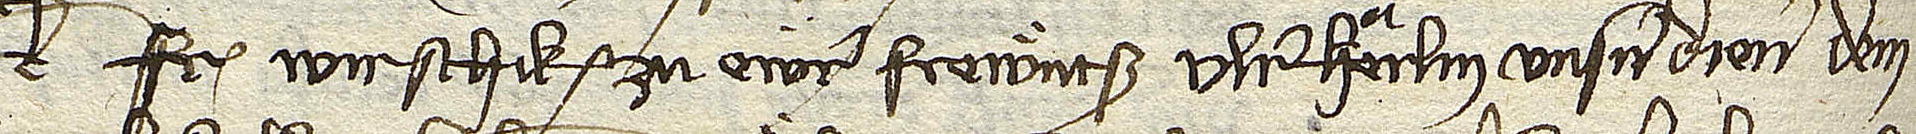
L* fr* wir ſchik* ʒu eẅr* freẅntſ* vlr* hërl*in vnſ*n dien* dem
